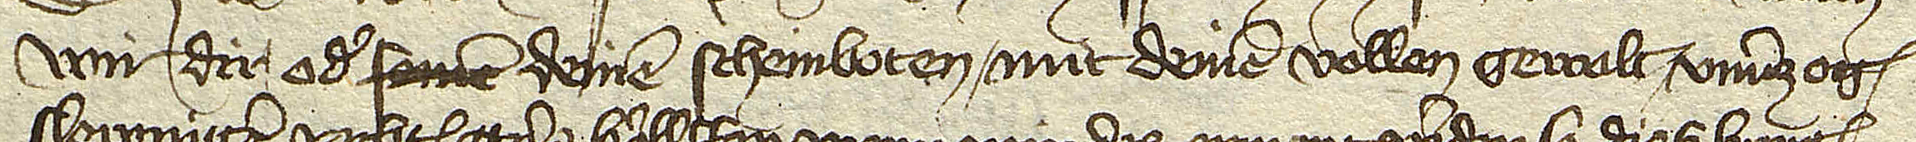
wir dir od* ſeine* deine* ſcheinboten / mit deine* vollen gewalt vnu*cʒog*
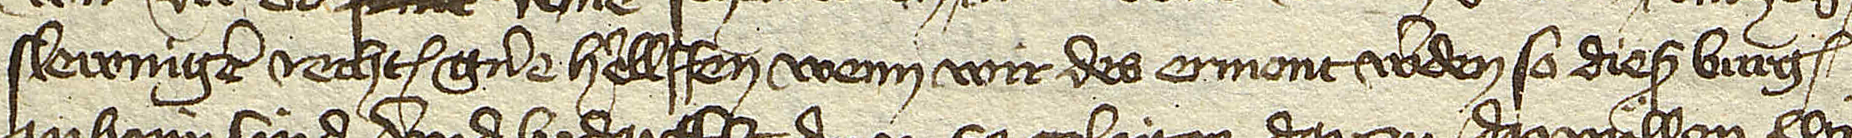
ſlewnige* recht* gn*e hellffen wenn wir des ermant w*den ſo dieſ* burg*
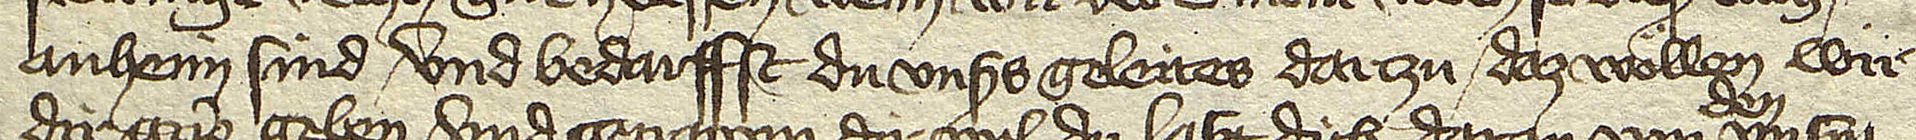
anheim ſind / vnd bedarffſt du vnſ*s geleits darcʒu / daʒ wöllen wir
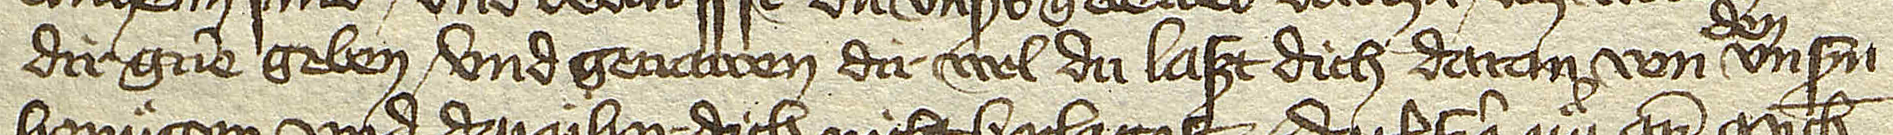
dir gn*e geben / vnd getrawen die wol du laſʒt dich daran von vnſ*n
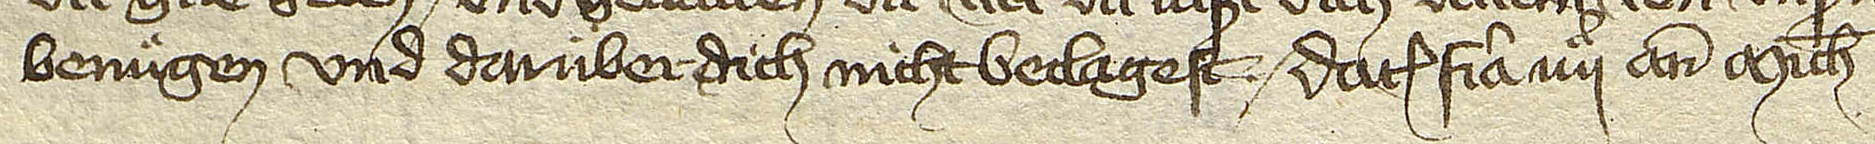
benügen vnd darüber dich nicht beclageſt . / Dat* fia* iiii* an* Mich*
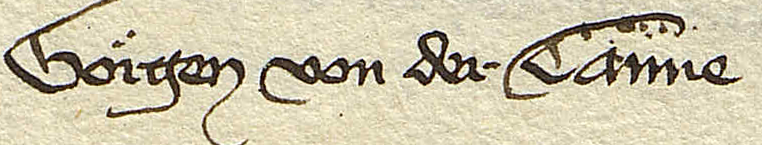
Görgen von der Tanne
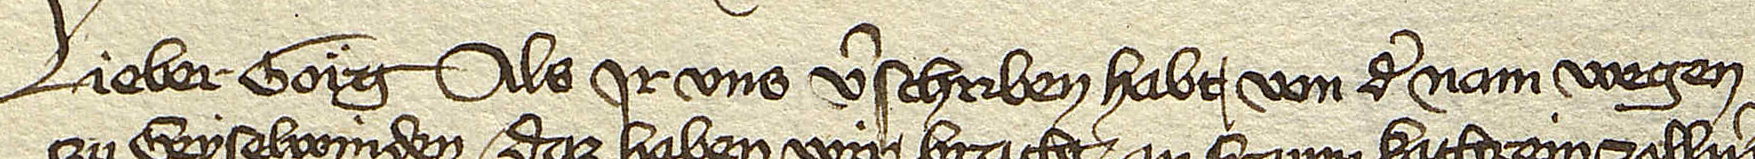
Lieber Görg Als Ir vns v*ſchriben habt / von d* nam wegen
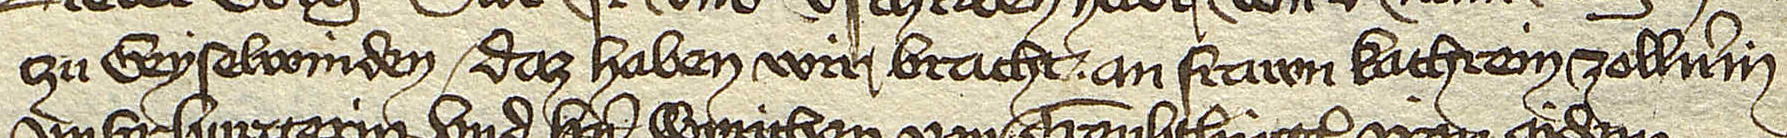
cʒu Geyſelwinden / daʒ haben wir bracht / . an frawn kathrein cʒolln*in
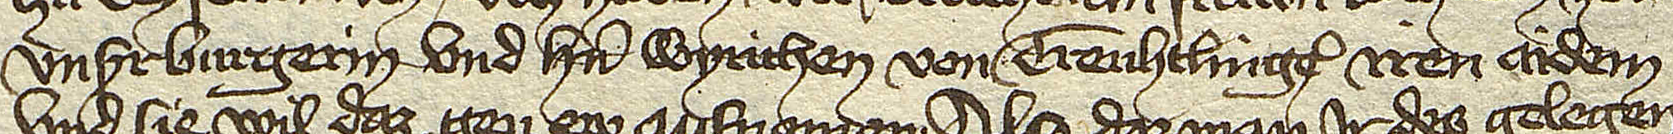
vnſ*r burgerin vnd hn* wyrichen von Treuhtling* iren aidem
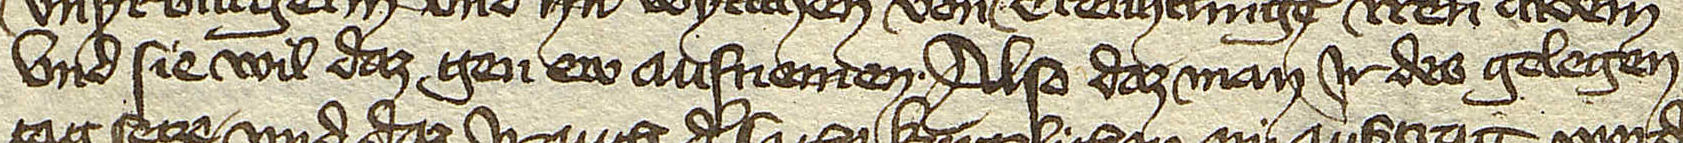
vnd ſie wil daʒ gen ew aufnemen . / Alſo daʒ man Ir des gelegen
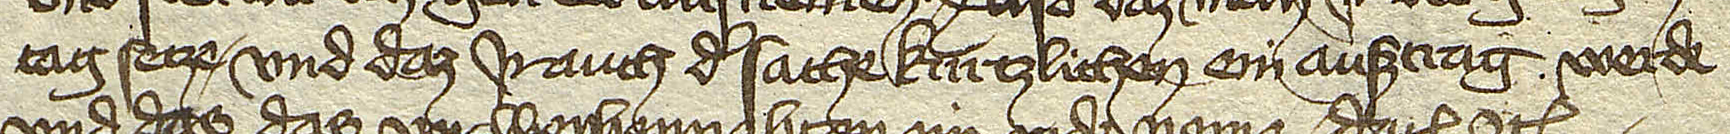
tag ſecʒe / vnd daʒ Ir auch d* ſache kürcʒlichen ein auſʒtrag werde
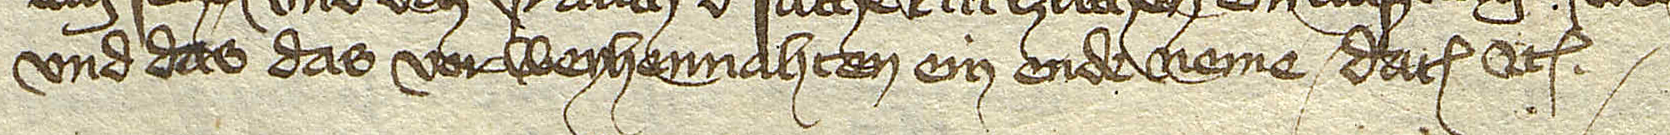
vnd das das vor weihennahten ein ende neme / dat* ec* . /
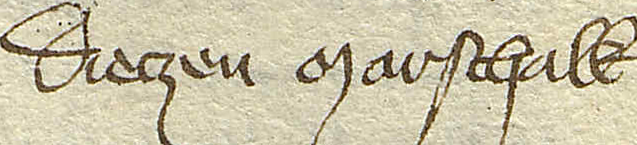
Diecʒen Marſchalk
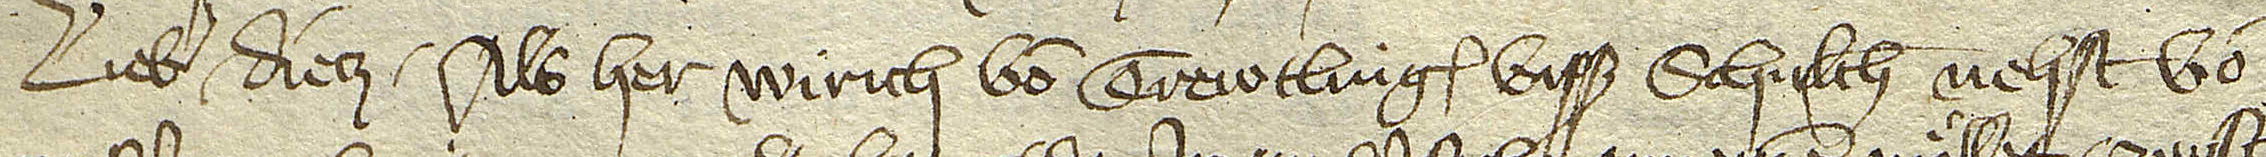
Lieb* / diecʒ / Als her wirich vo* Trewtling* biſſ* Schulth* nehſt vo*
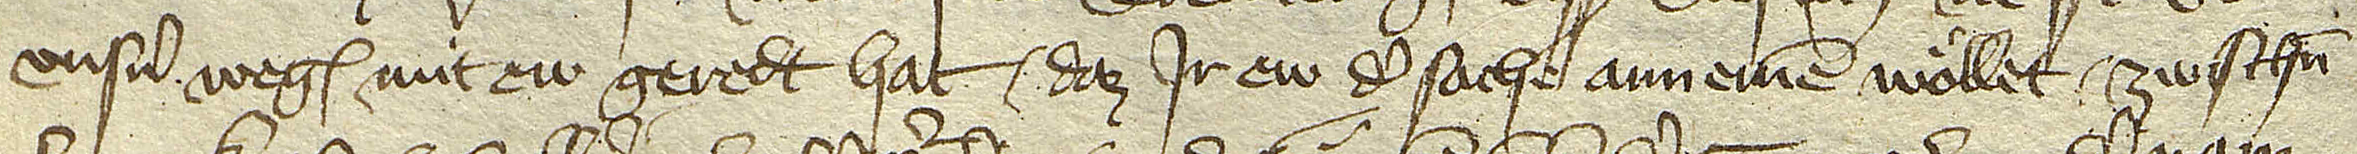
vnſn* weg* mit ew geredt hat / daʒ Ir ew d* ſache anneme* wöllet / cʒwiſchn*
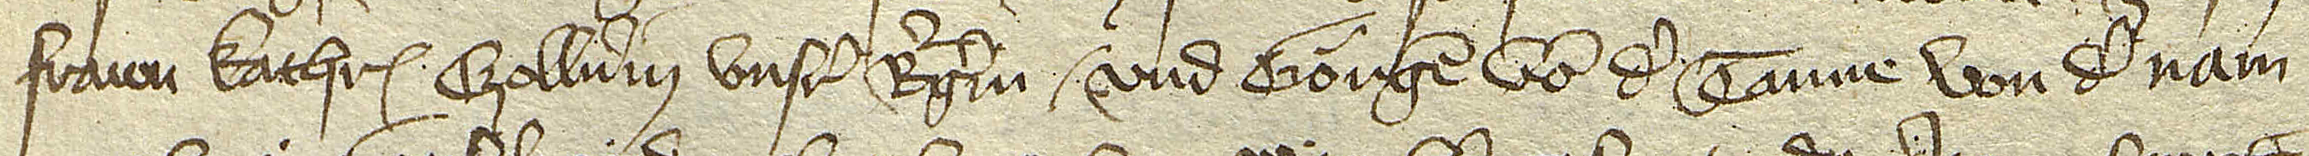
frawn kathr* Cʒolln*in vnſr* B*g*in / vnd Görge* vo* d* Tanne von d* nam
